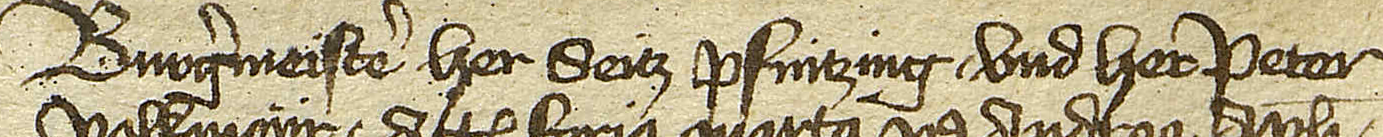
Burg*meiſte* her Seicʒ Pfincʒing / vnd her Peter
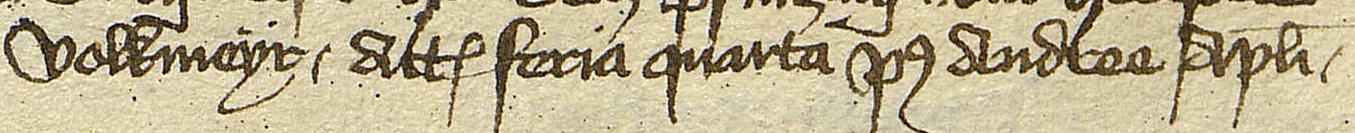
Volkmeyr / Act* feria quarta p* Andree Apli* /
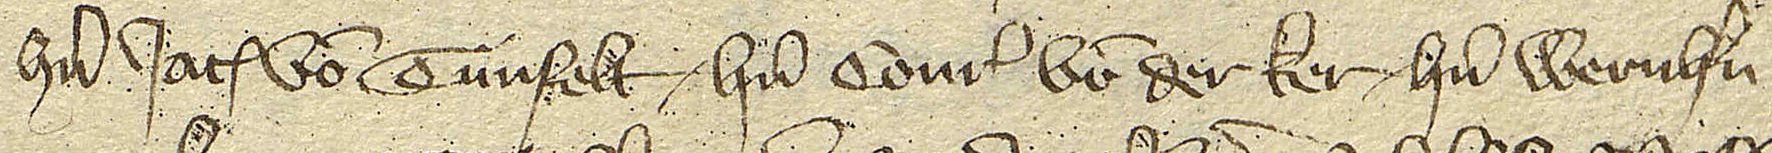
hn* Iac* vo* Tünfelt / hn* Conr* vo* der ker / hn* Wernh*n
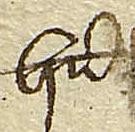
hn*
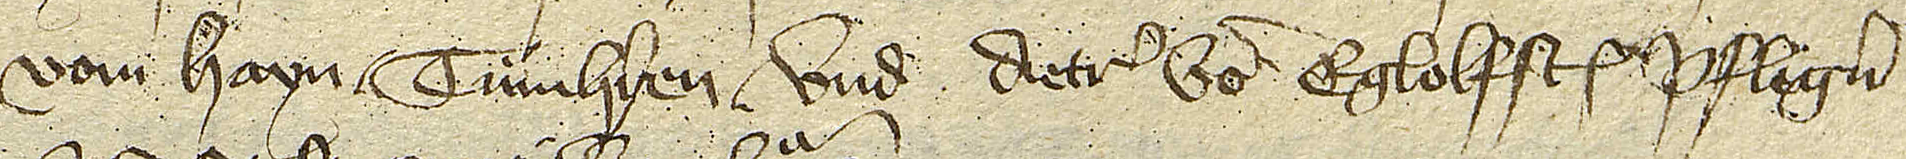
von hayn / Tümhr*en / vnd dietr* vo* Eglolfſt* Pflegn*
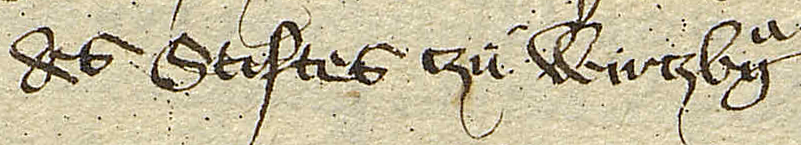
des Stiftes cʒü Wircʒb*g
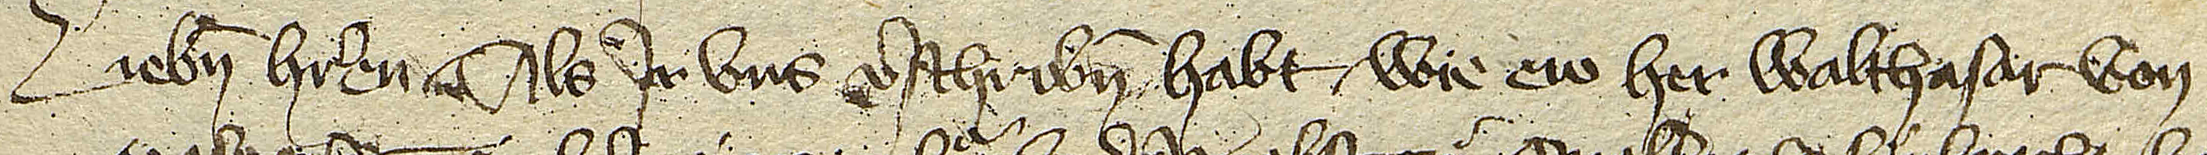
Liebn* hr*en / Als Ir vns v*ſchribn* habt / wie ew her Walthaſar von
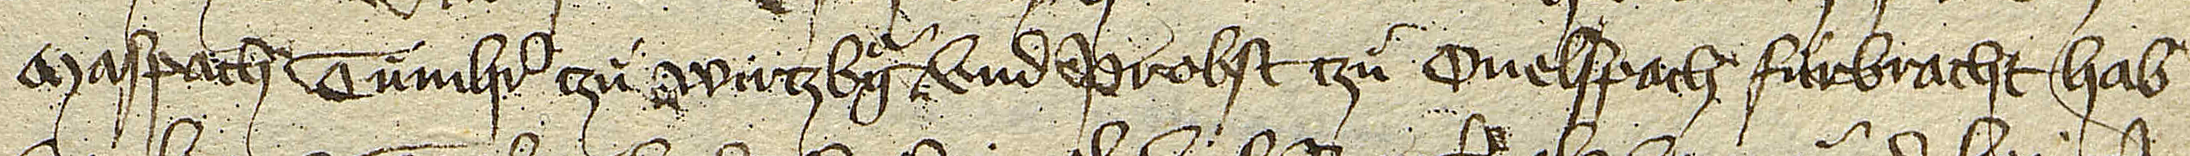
Maſpach Tümhr* cʒü wircʒb*g / vnd Probſt cʒü Onelſpach fürbracht hab
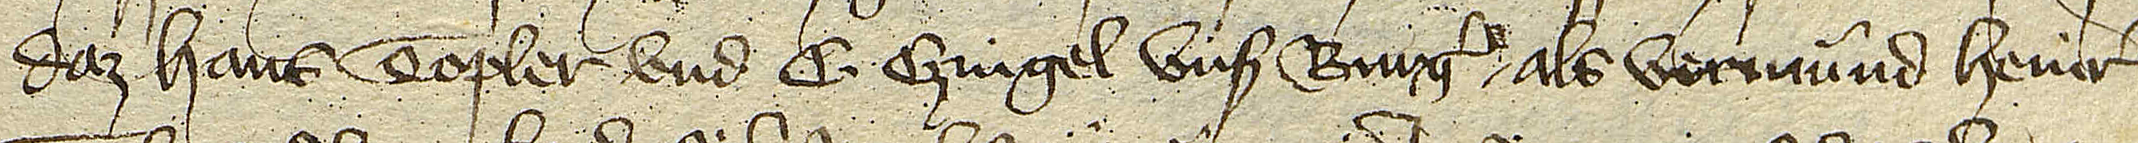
daʒ hans Topler vnd C. Cʒingel vnſ* Burg* / als vormünd heinr*
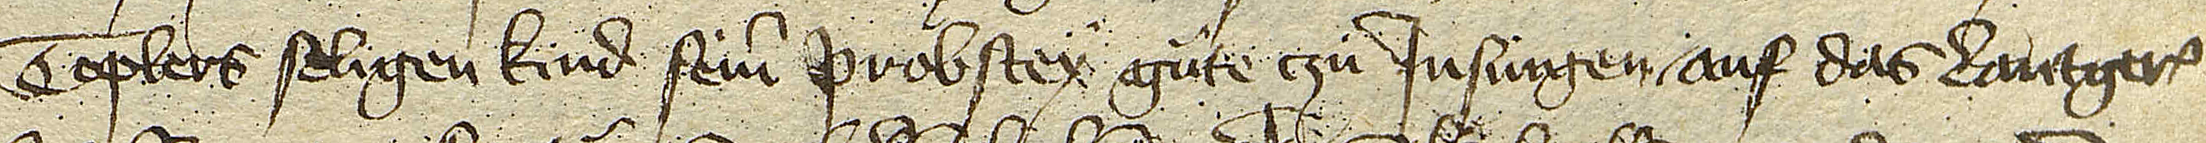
Toplers ſeligen kind ſein* Probſtey güte cʒü Inſ%%gen / auf das Lantger*
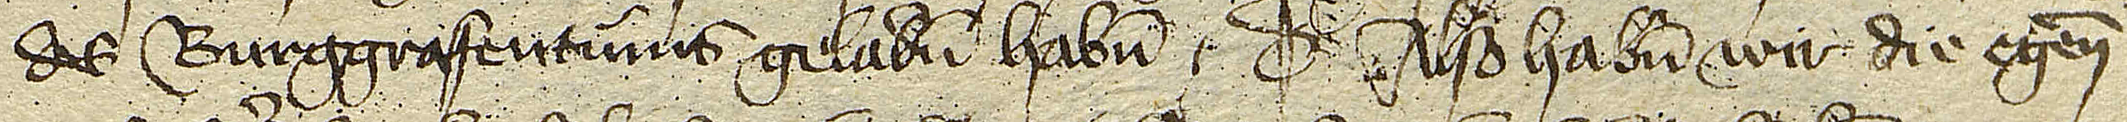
des Burggrafentüms geladn* habn* / D Alſo habn* wir die egen*
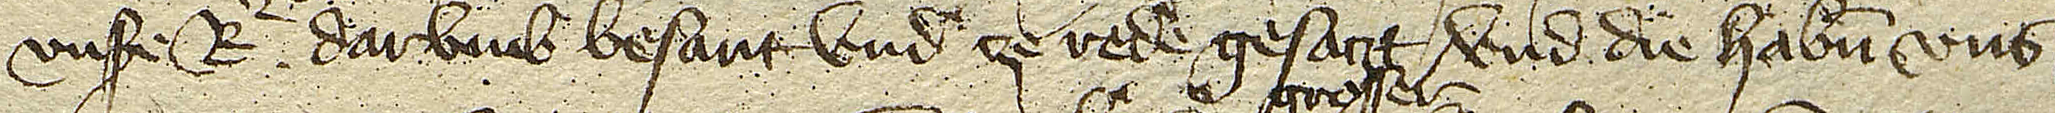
vnſ*e B* darvmb beſant vnd cʒe rede geſacʒt / vnd die habn* vns
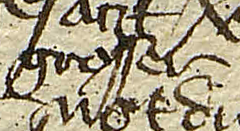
groſſer
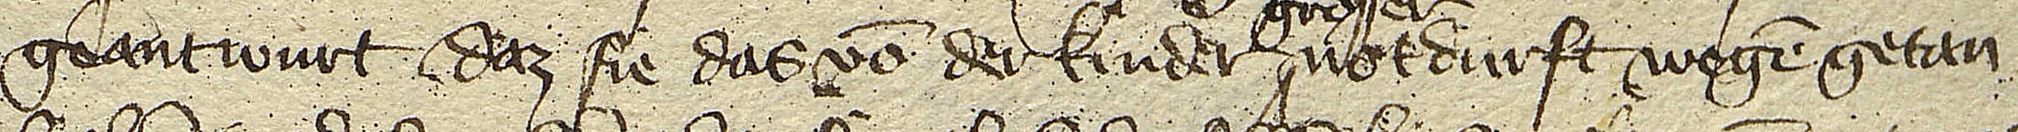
geantwurt / daʒ ſie das vo* der kinder notdurft wege* getan
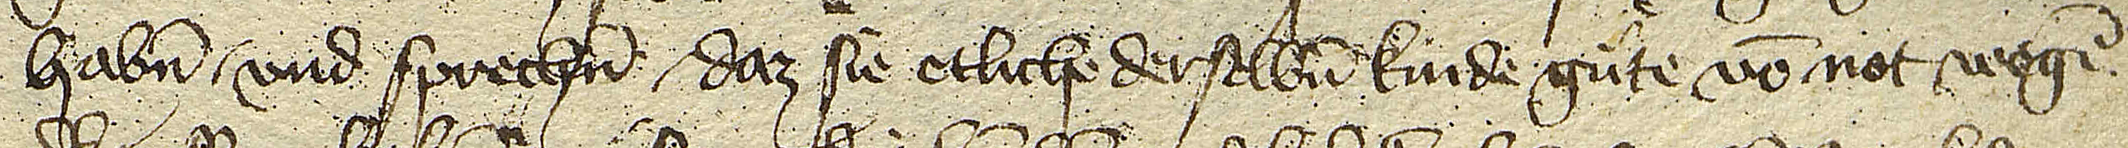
habn* / vnd ſprechn* / daʒ ſie etliche derſelbn* kinde güte vo* not wege*
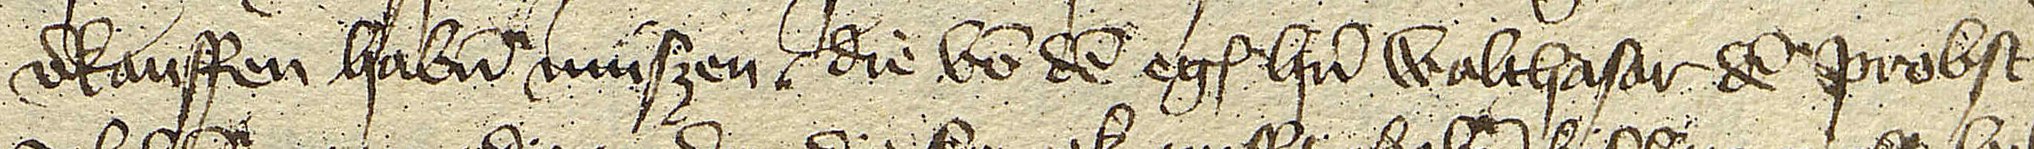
v*kauffen habn* müſʒen / die vo* de* eg* hn* Walthaſar d* Probſt
